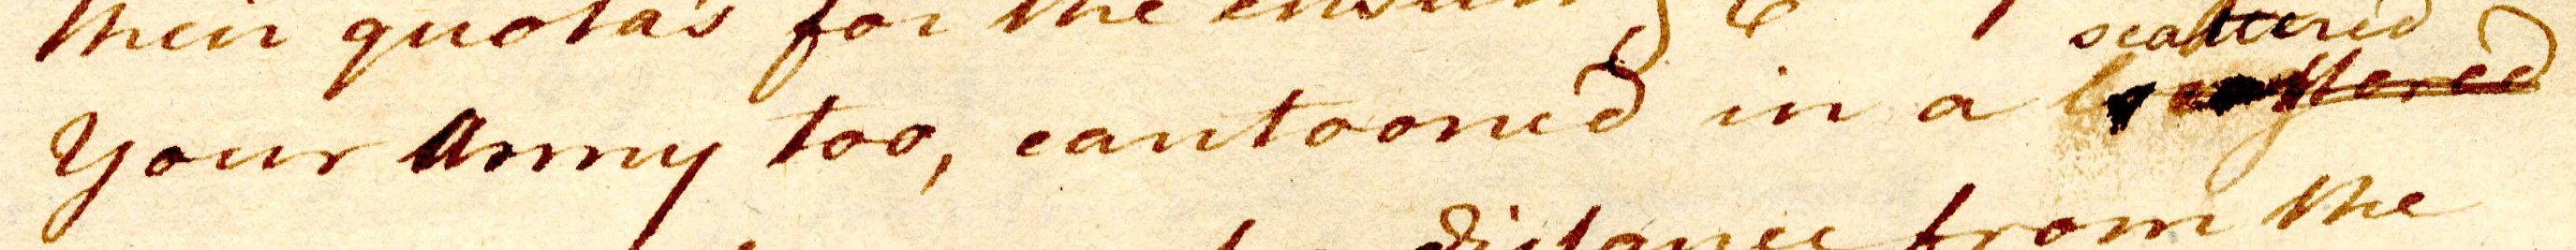your Army too, {cantooned} in a [________]
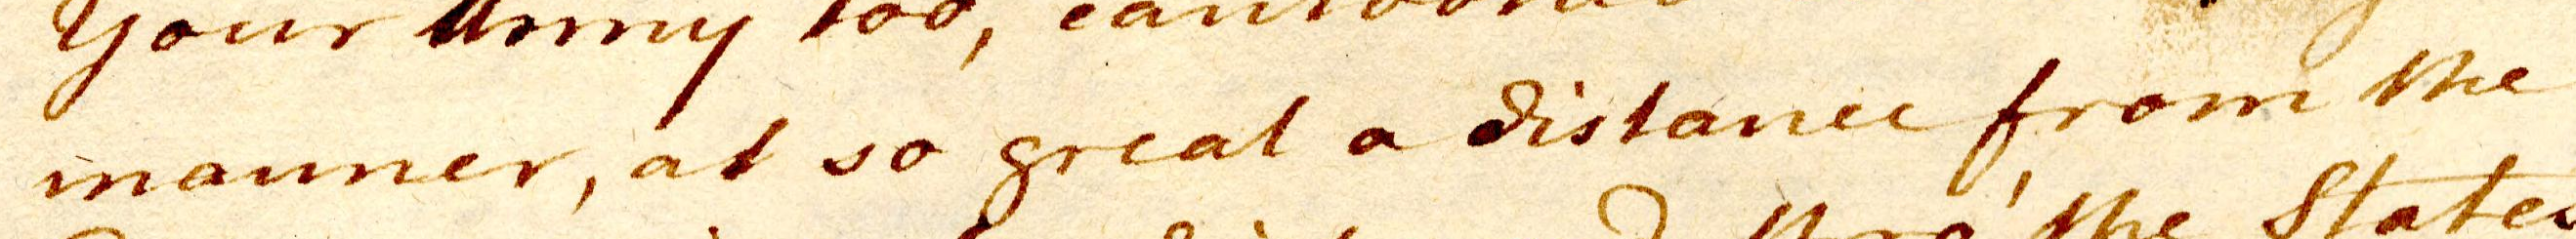manner, at so great a distance from the
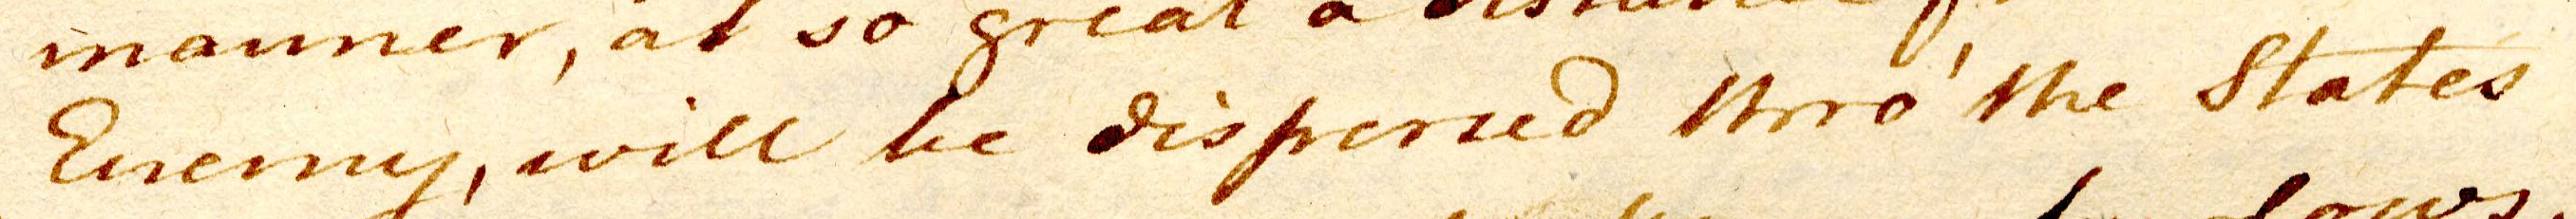Enemy, will be dispersed thro' the States
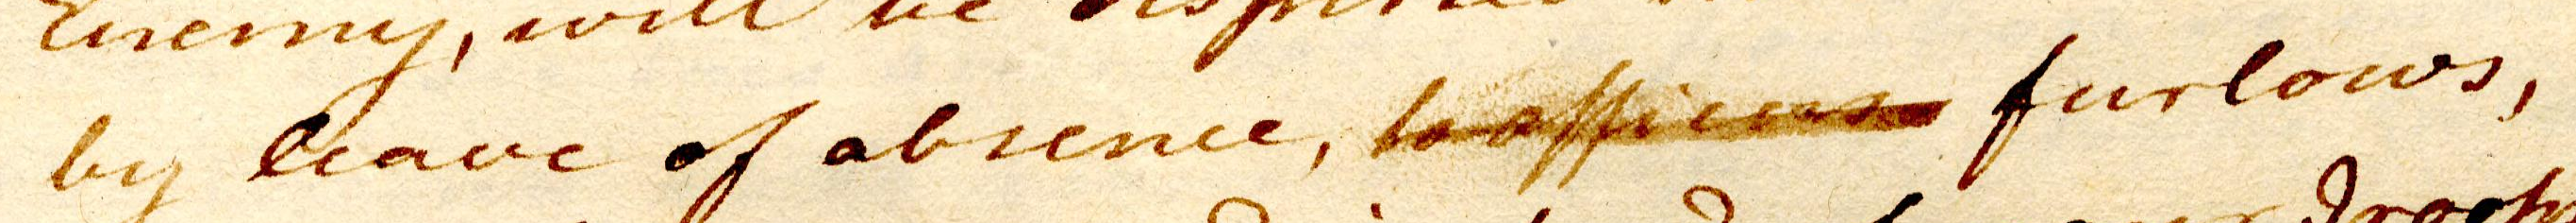by leave of absence, [to officers] furlows,
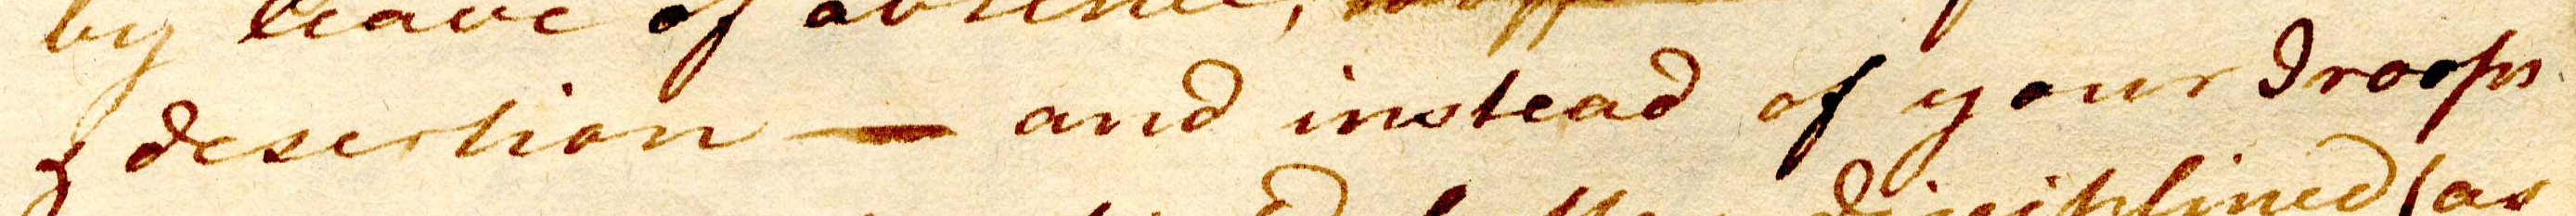& desertion- and instead of your troops
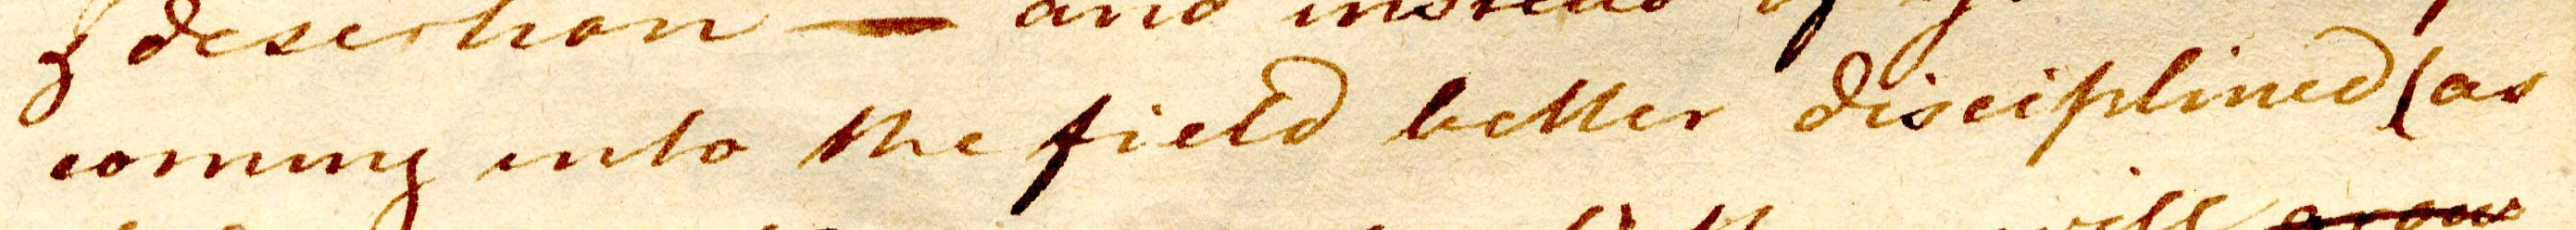coming into the field better disciplined (as
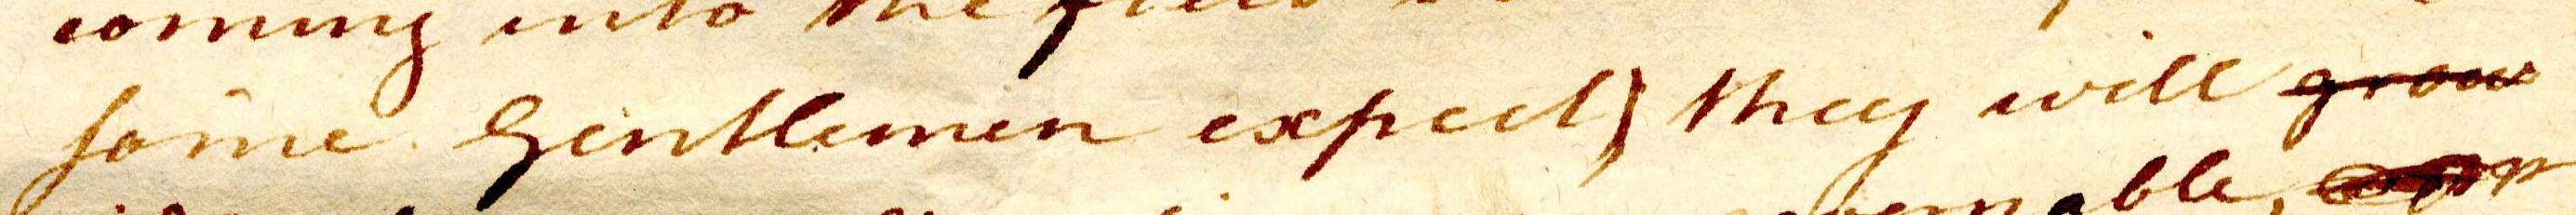some Gentlemen expect) they will [grow]
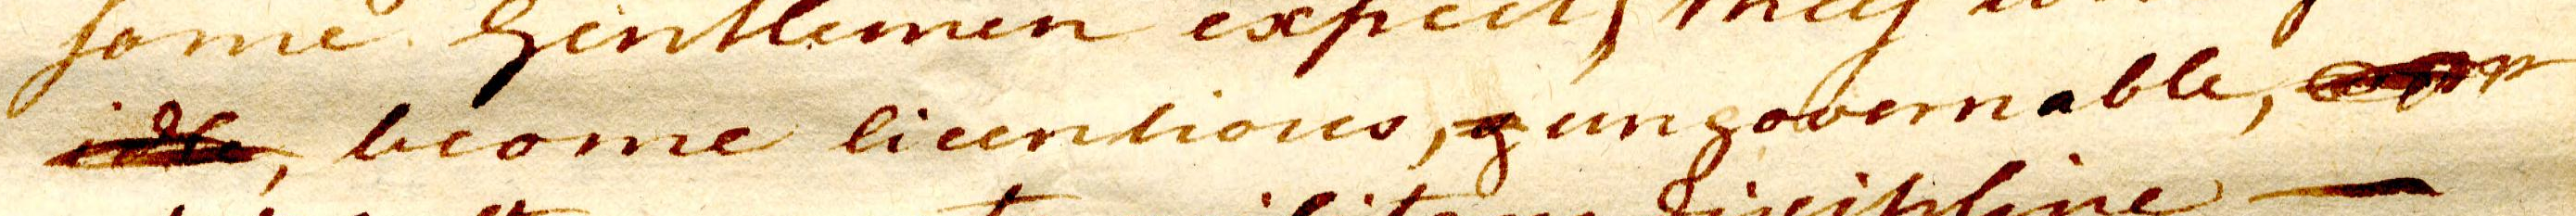[idle] become licentious, & ungovernable, [____]
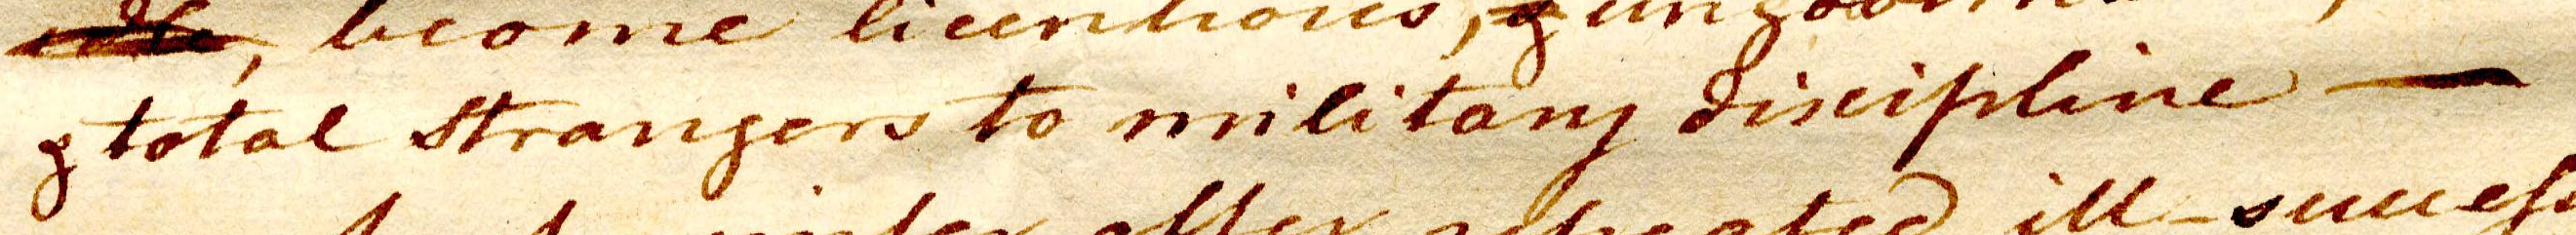& total strangers to military discipline-
